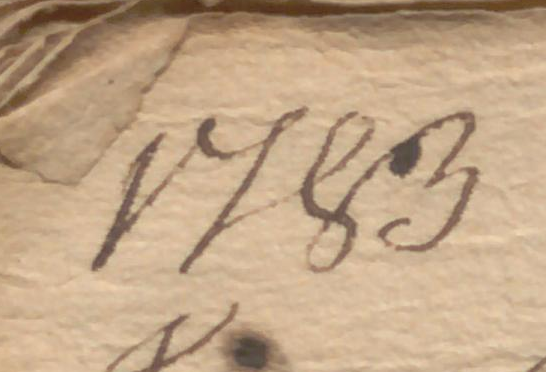1783
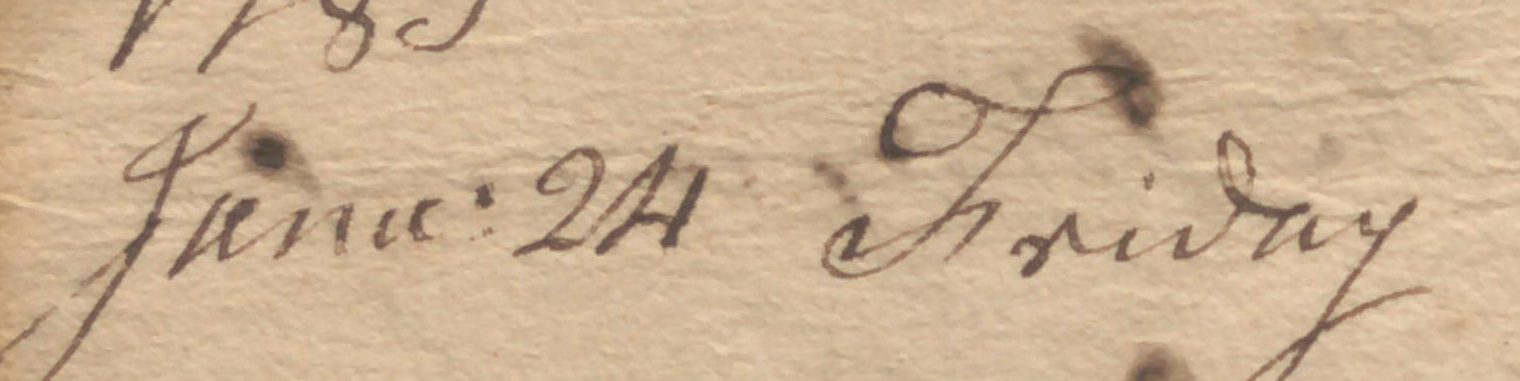Janu. 24 Friday
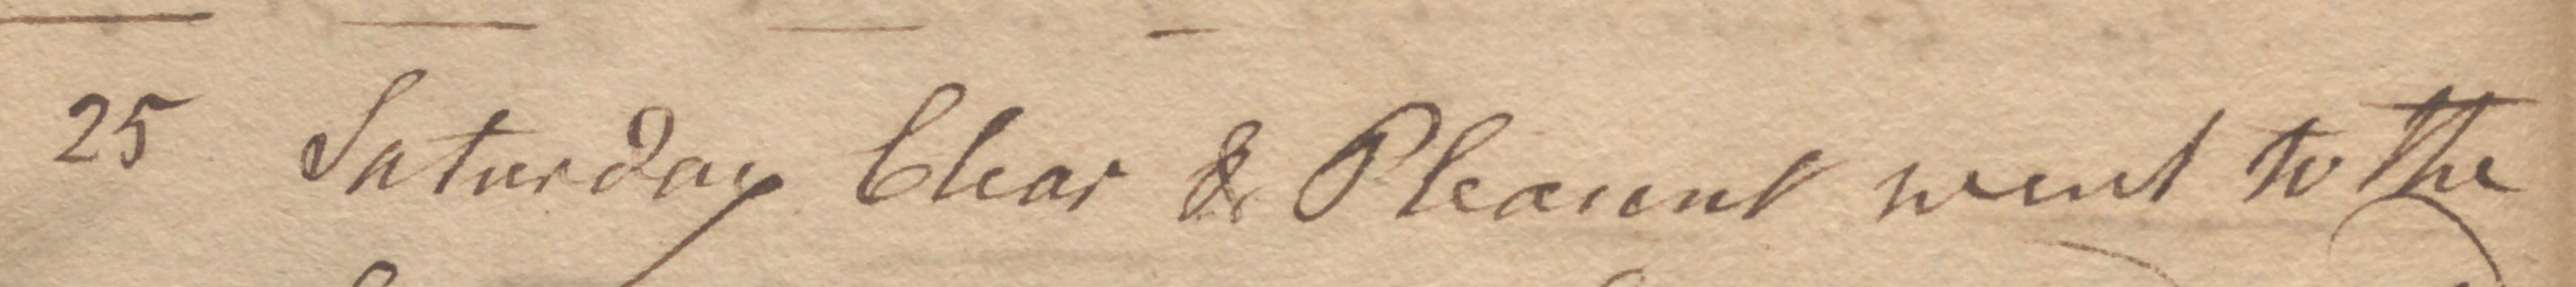25 Saturday Clear & Pleasent went to the
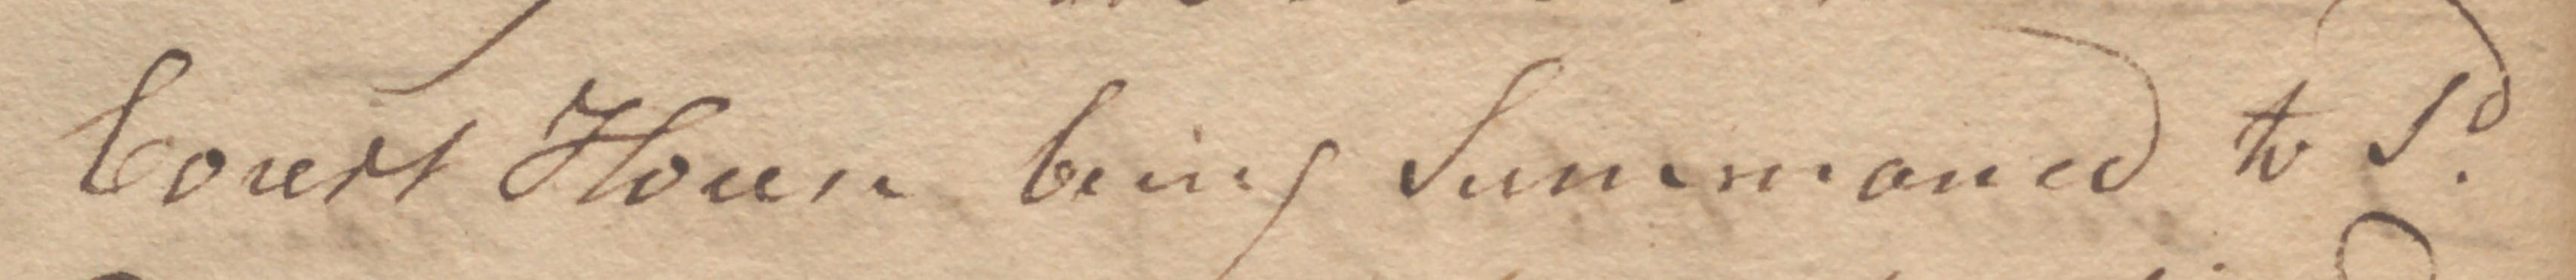Court House being Summaned to s^d.
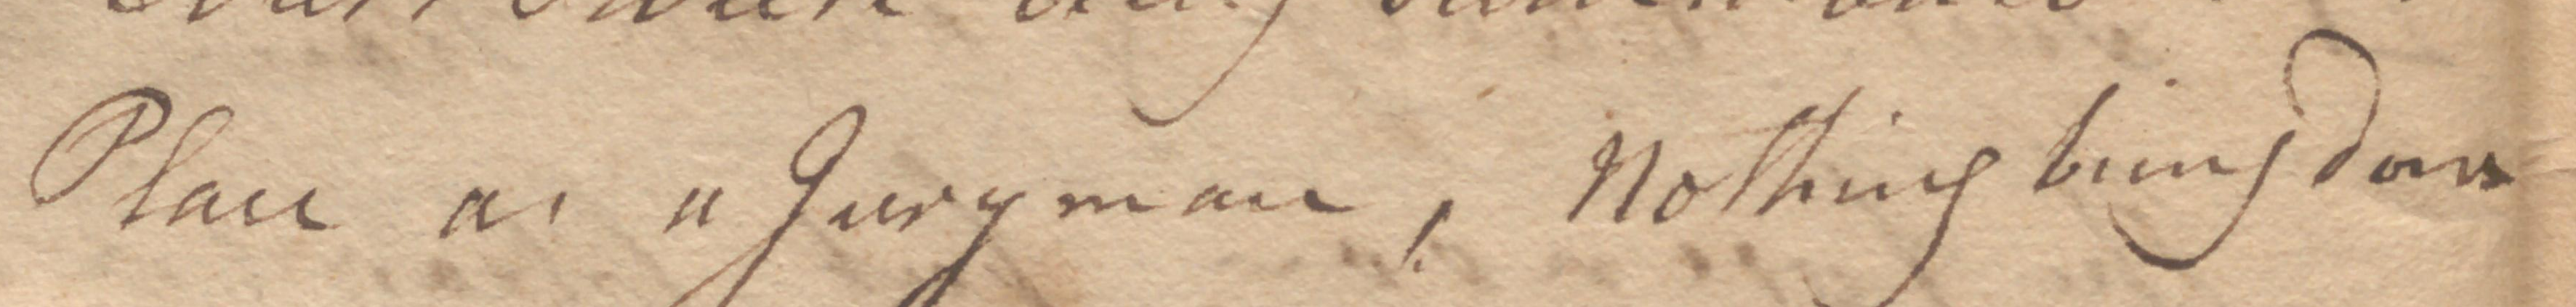Place as a Juryman, Nothing being done
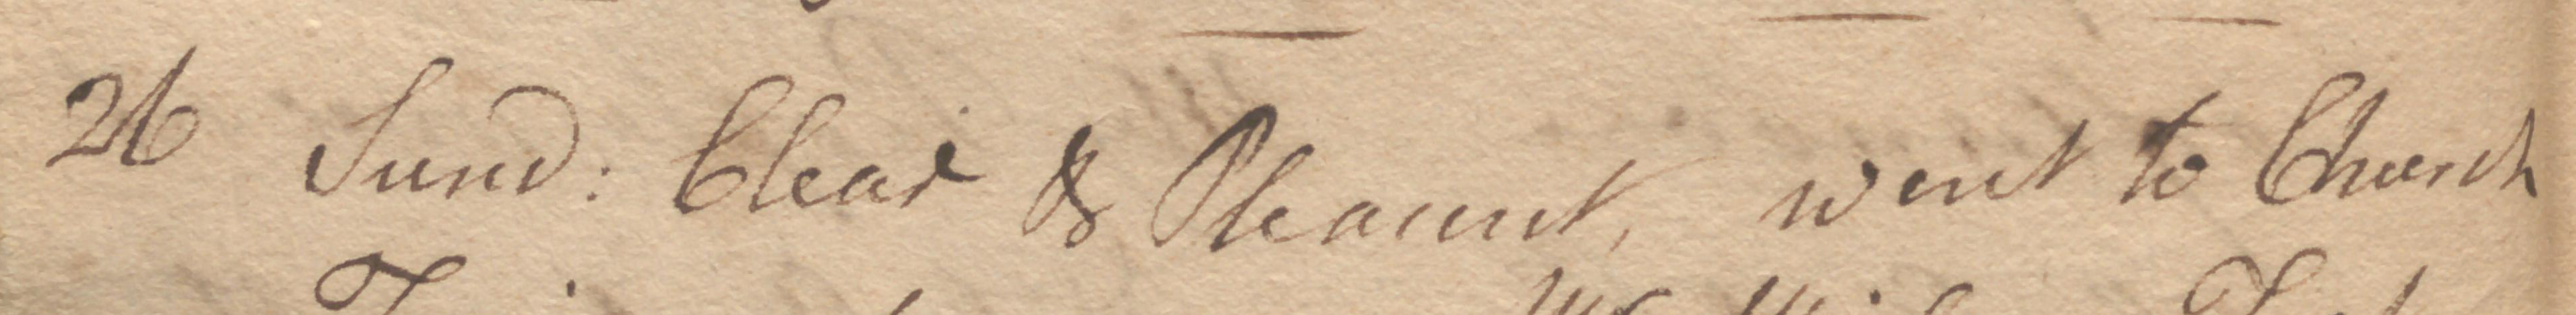26 Sund. Clear & Pleasent went to Church
